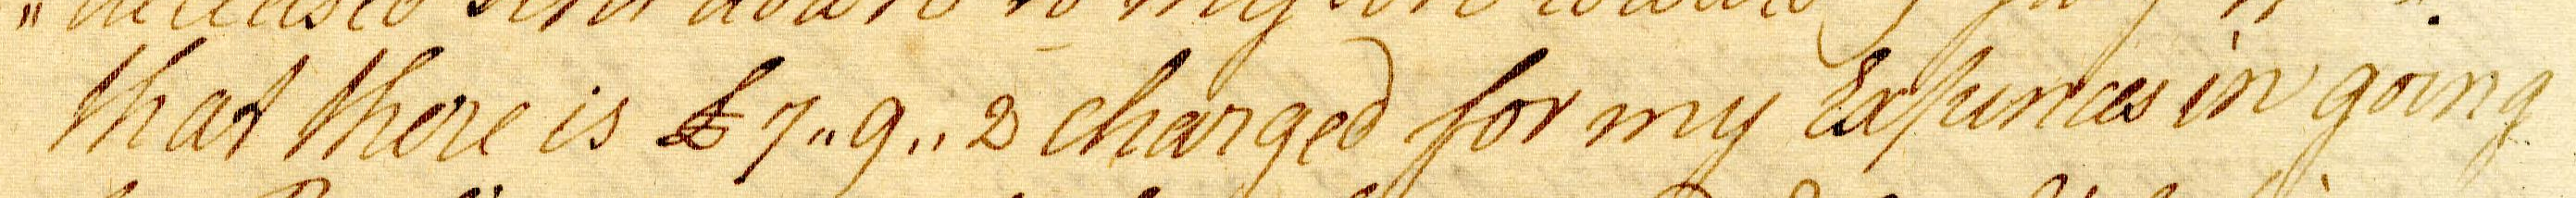that there is £7..9..2 charged for my Expences in going
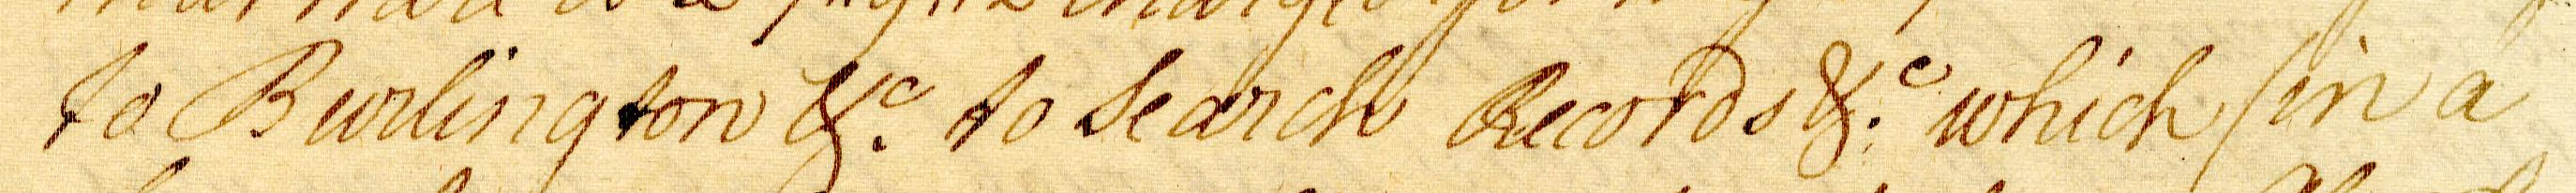to Burlington &^c. to Search Records &^c. which (in a
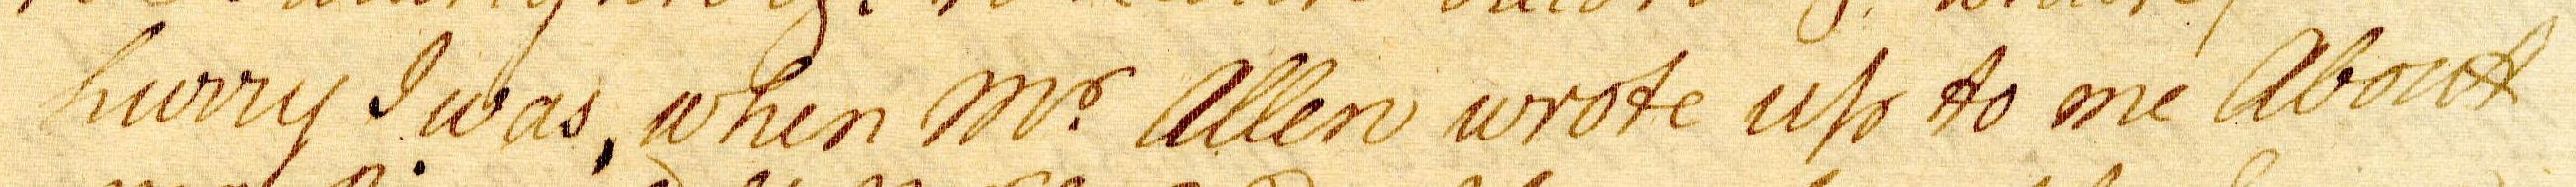hurry I was, when M^r. Allen wrote up to me About
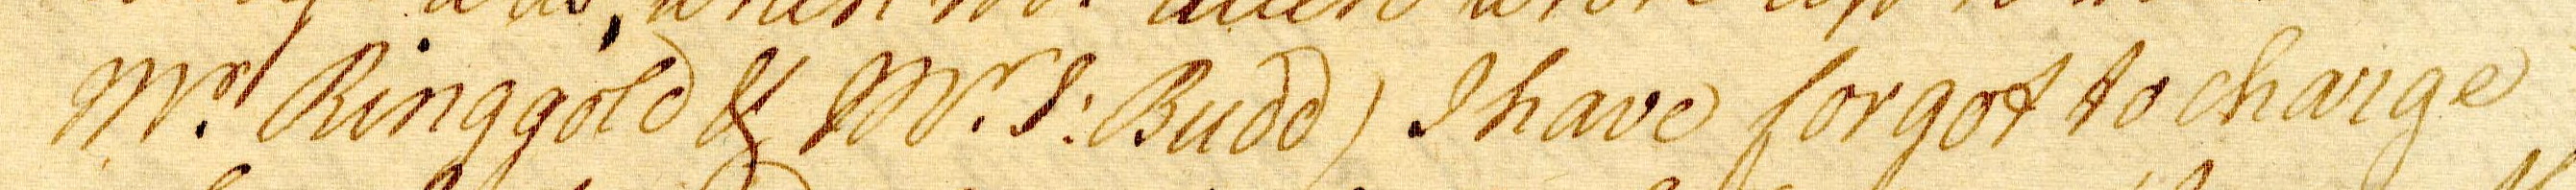M^r. Ringgold & M^r. S: Budd) I have forgot to charge
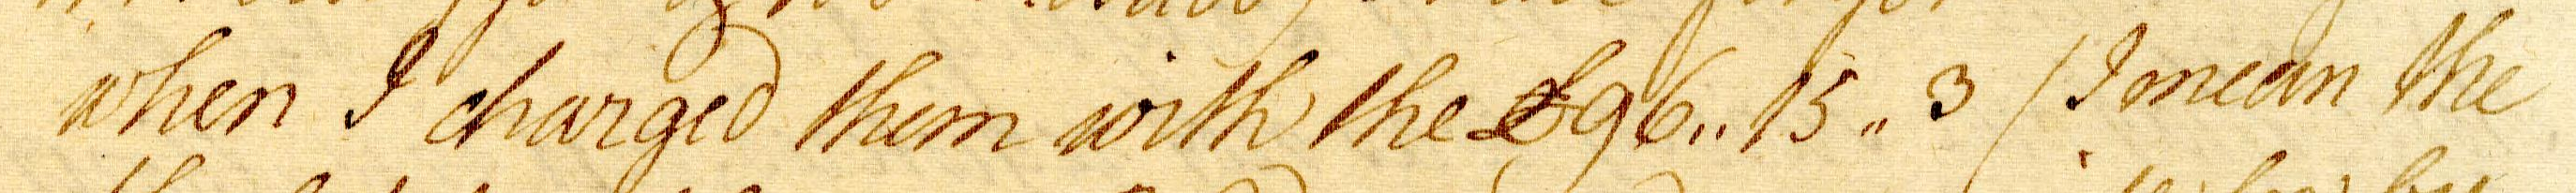when I charged them with the £96..15..3 (I mean the
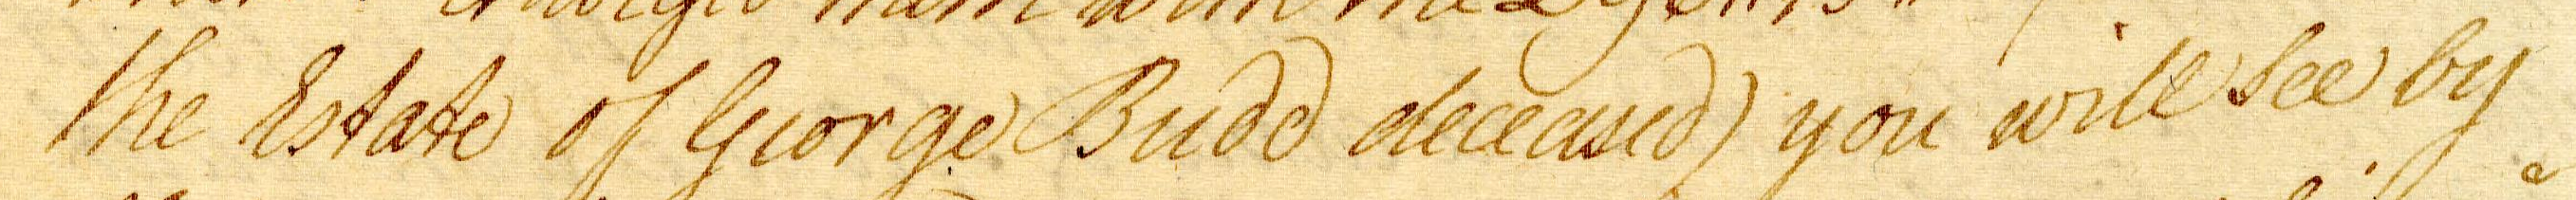the Estate of George Budd deceased) you will See by
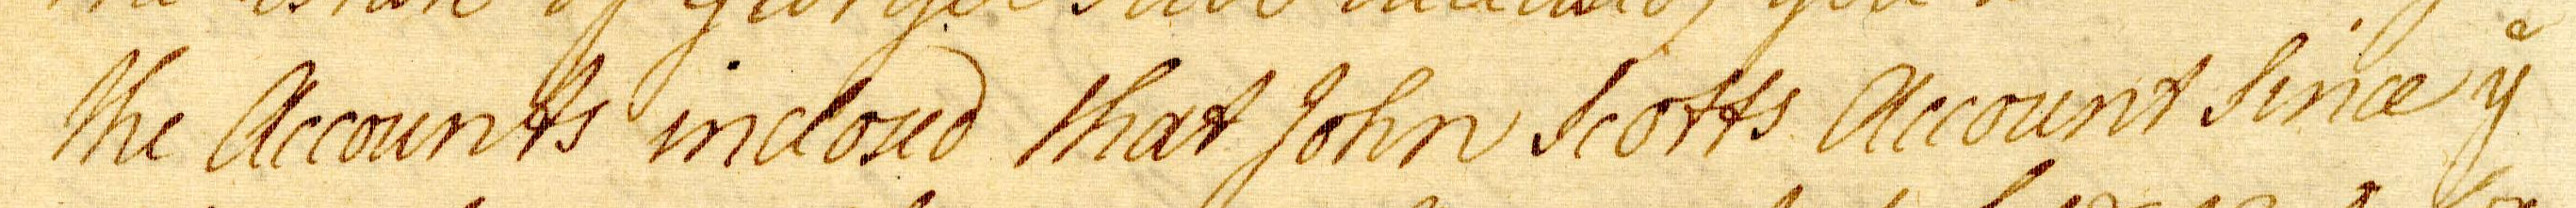the Accounts inclosed that John Scotts Account Since y^e
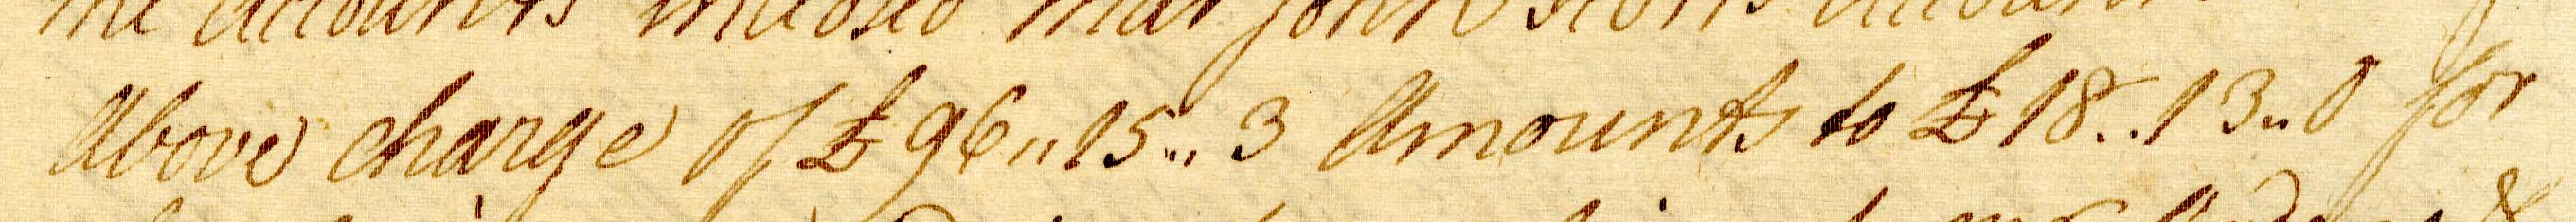Above charlge of £96..15..3 Amounts to £18..13..0 for
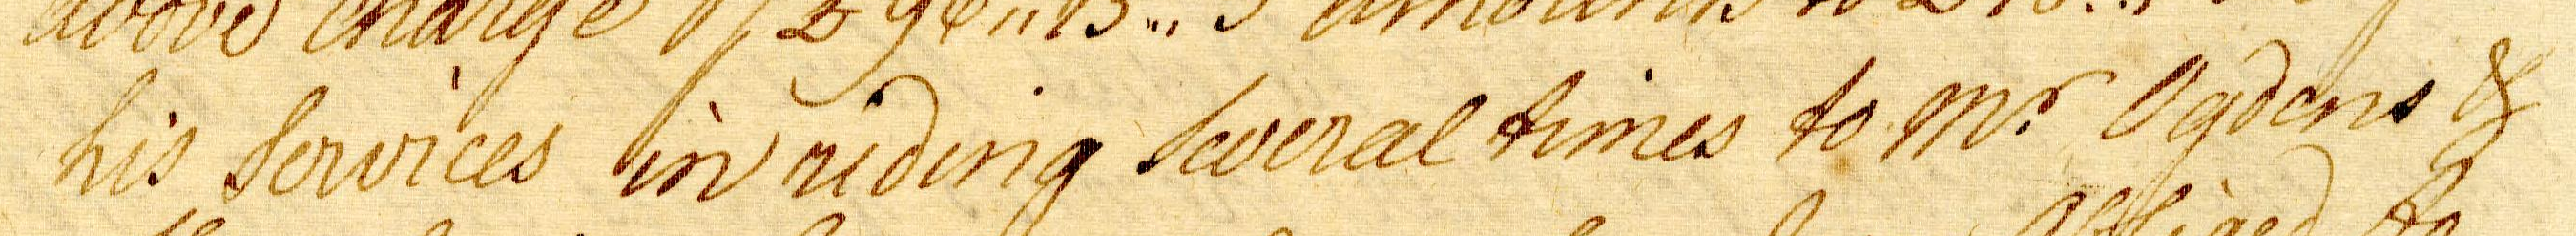his Services in riding several times to M^r. Ogdens &
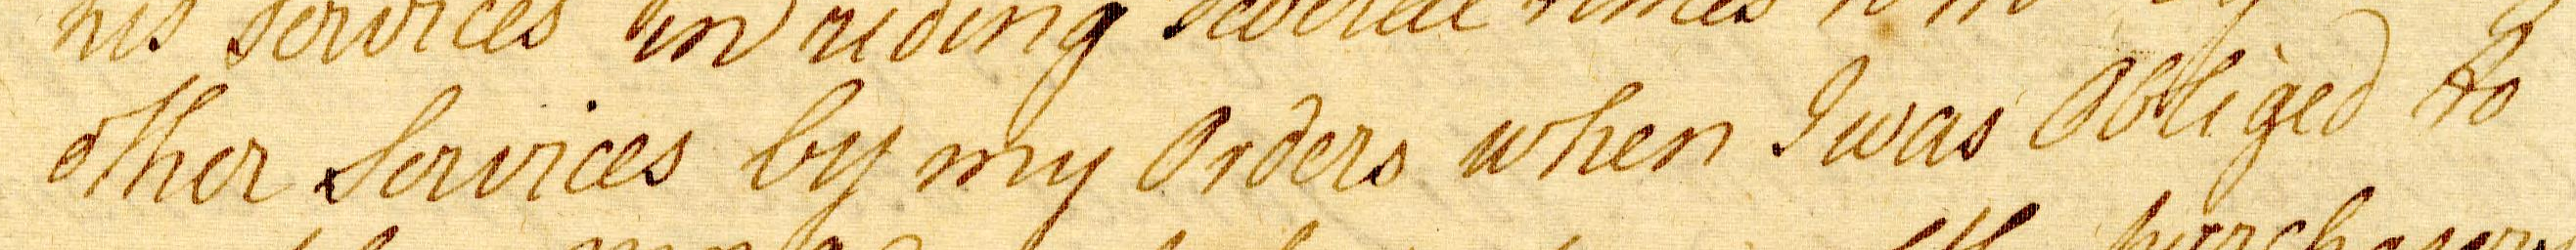other Services by my Orders when I was Obliged to
